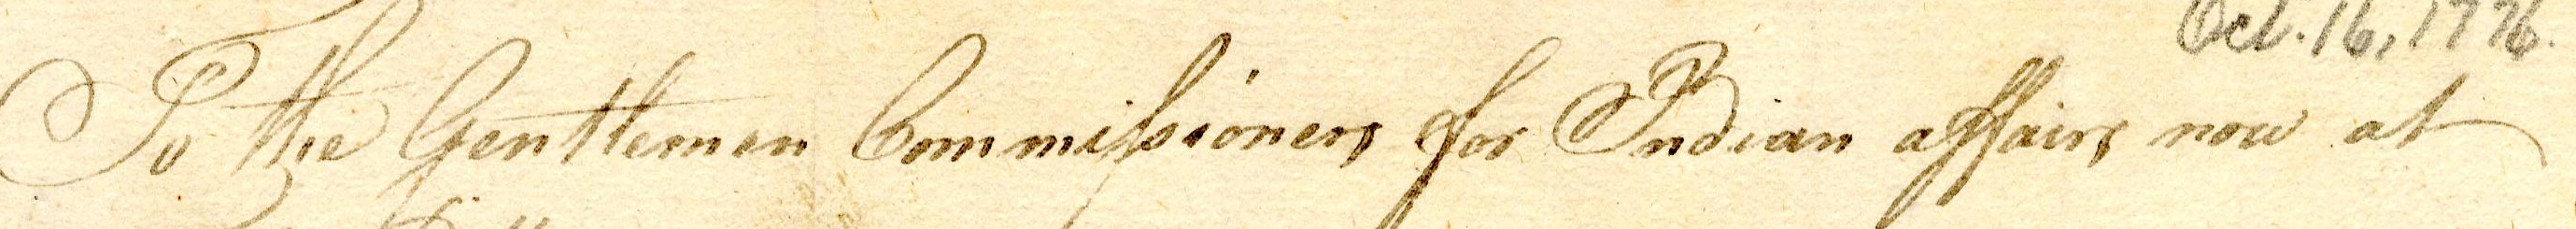To the Gentlemen Commissioners for Indian affairs now at
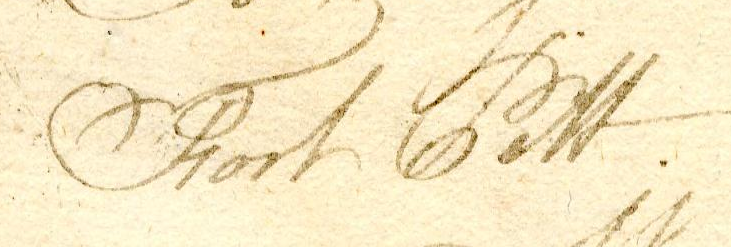Fort Pitt.
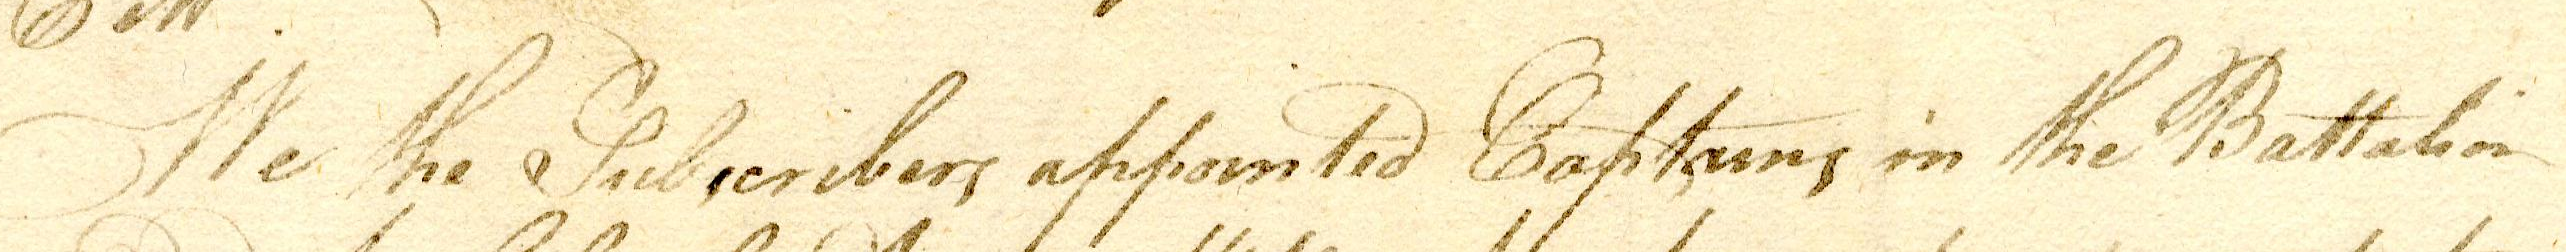We the Subscribers appointed Captains in the Battalion
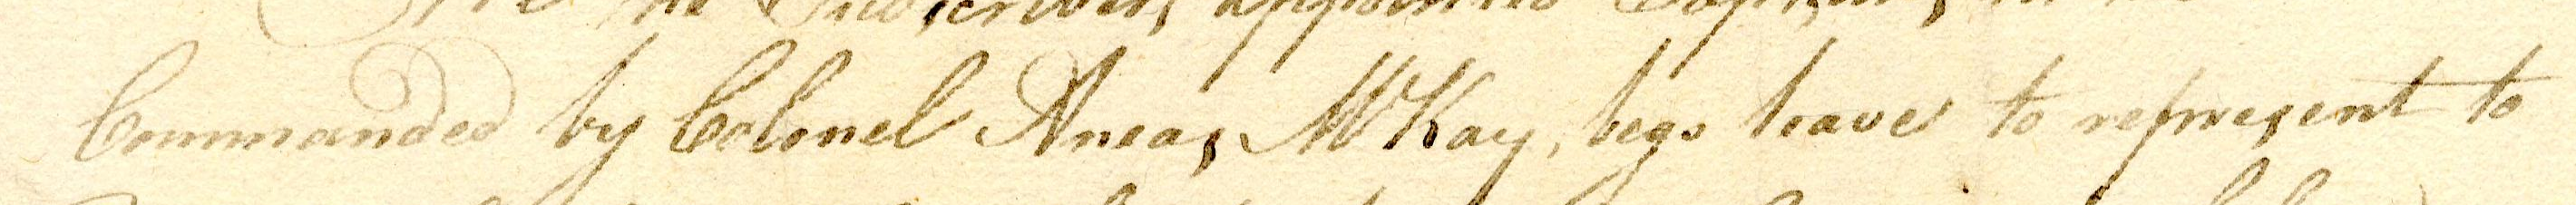Commanded by Colonel Aeneas M^cKay, begs leave to represent to
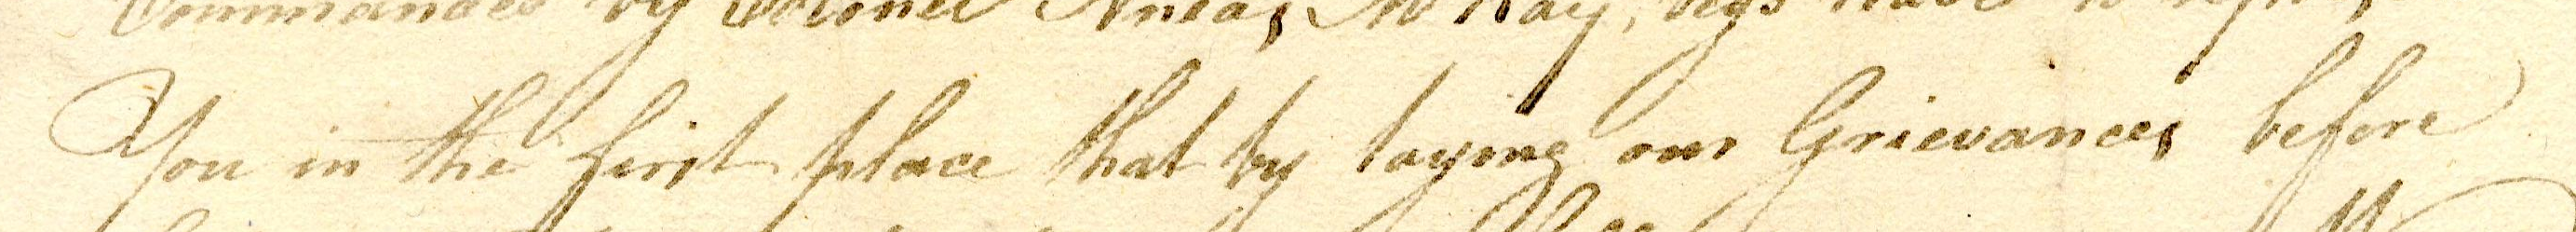You in the first place that by laying our Grievances before
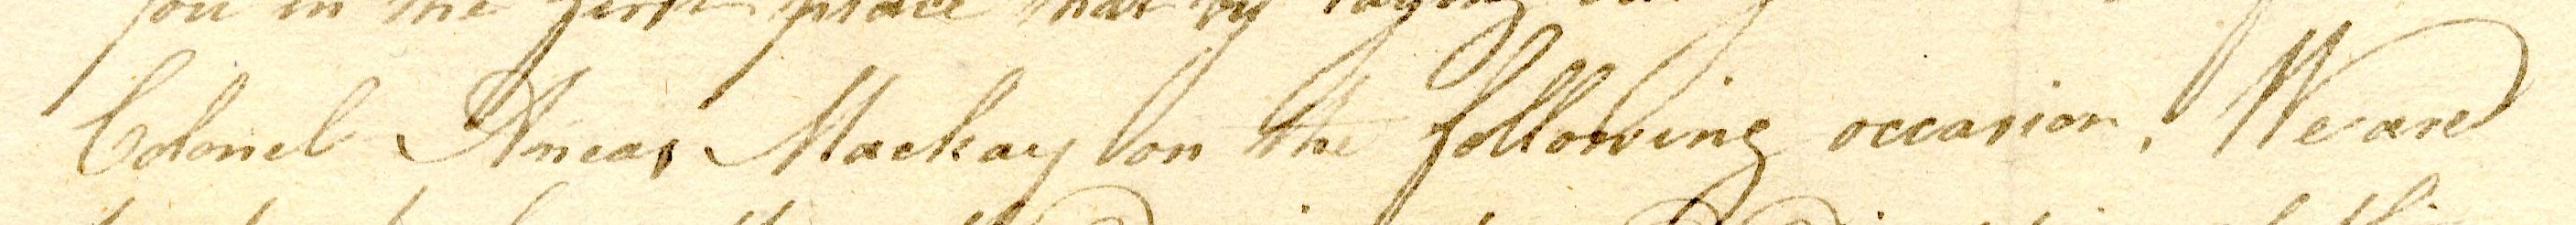Colonel Aeneas Mackay on the following occasion. We are
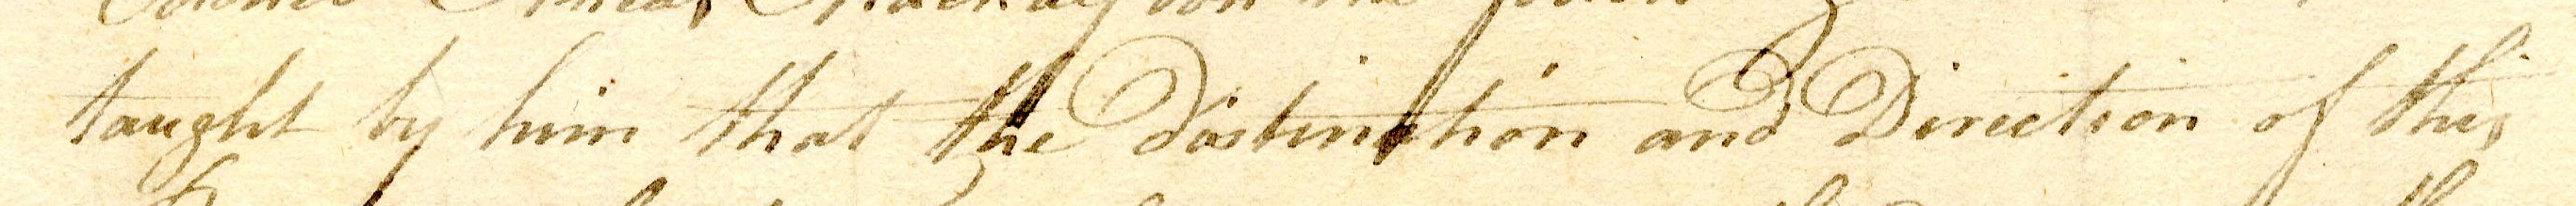taught by him that the distinction and Direction of the
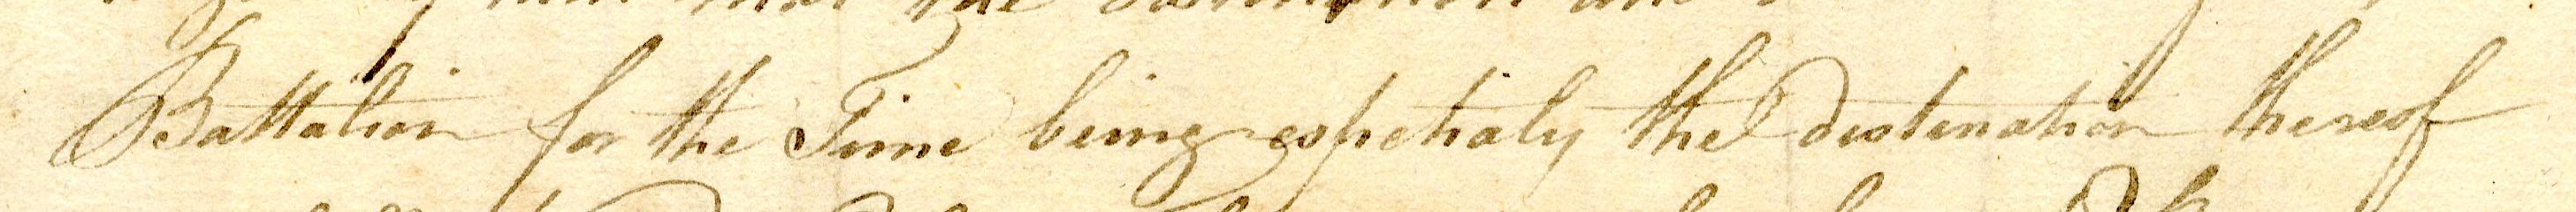Battalion for the Time being especially the destination hereof
